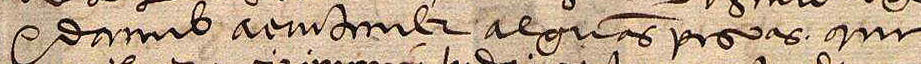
e damdo a emtender alguās pesoas que
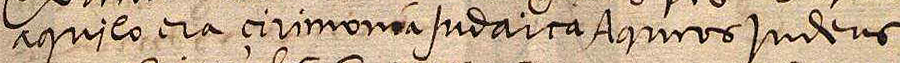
aqujlo era cirimonia Judaica A que os Judeus
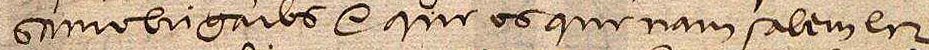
sam obrigados e que os que nam sabem ler
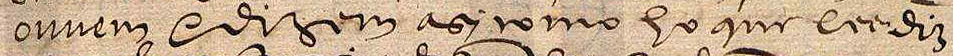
ouuem e dizem asy como ho que lee diz
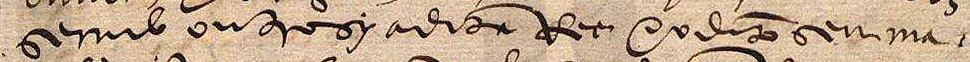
semdo outrosy a dita Ree e o dito seu ma
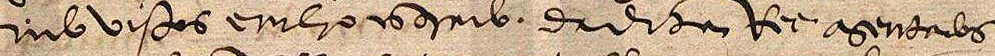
rido vistos em ho estrado. da dita Ree asentados
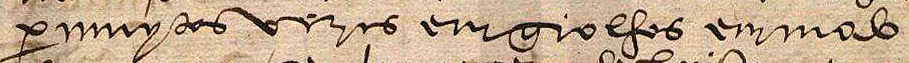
ꝑ muytas vezes em giolhos em modo
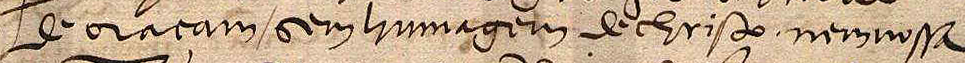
de oraçam / sem humagem de christo nem nossa
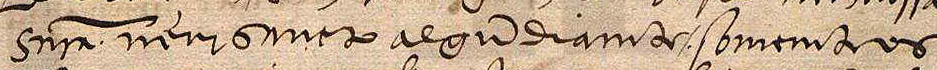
Snr̄a nem sancto algū diamte / somemte os
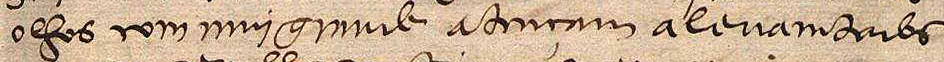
olhos com muj grande atençam aleuamtados
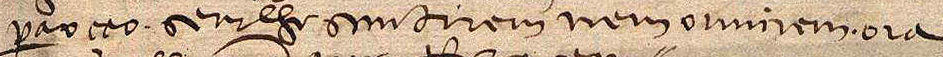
ꝑa o ceo sem lhe semtirem nem ouuirem ora
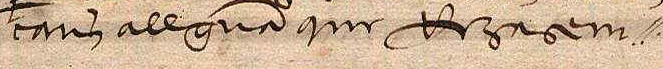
çam allguā que Rezasem //
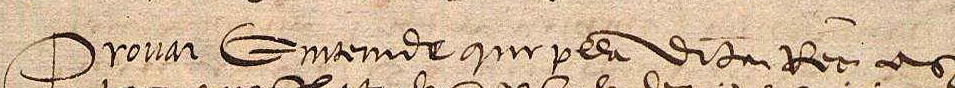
Prouar Emtemde que pll̄a dita Ree asy
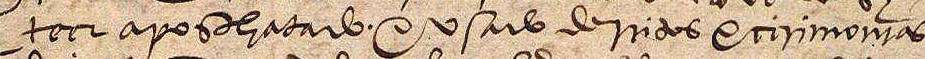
teer aposthatado. e vsado de rritos e cirimonias
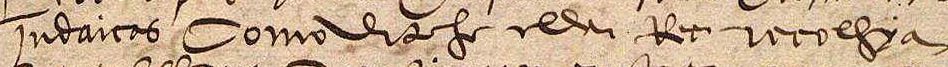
Judaicas Como dito he ella Ree recolhya
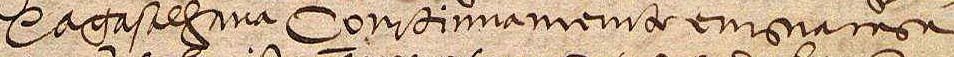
e agasalhaua Comtinuamemte em sua casa
